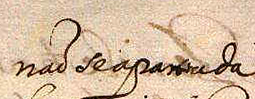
naõ se apartou da
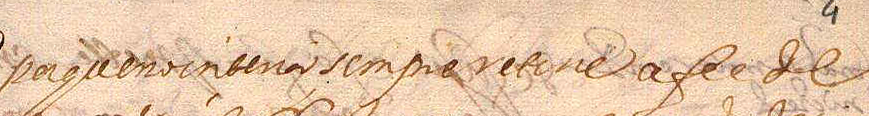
porque no interior sempre reteue a fee de
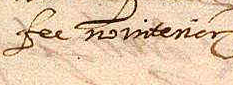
fee no interior
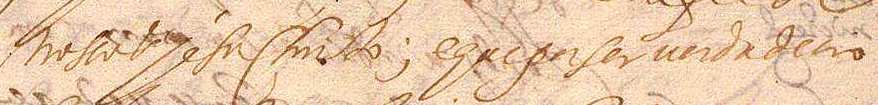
nosso sor jesu Christo; e que por ser uerdadeiro
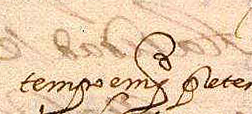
tempo em q̄ preten
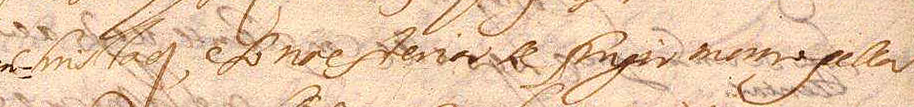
christaõ, e so no exterior se fingir mouro pella
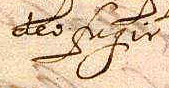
deo fugir
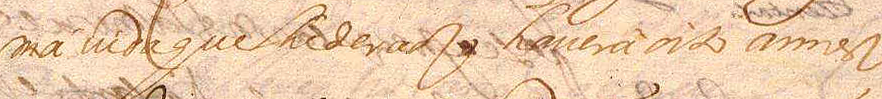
má uida que lhe deraõ hauerà oito annos
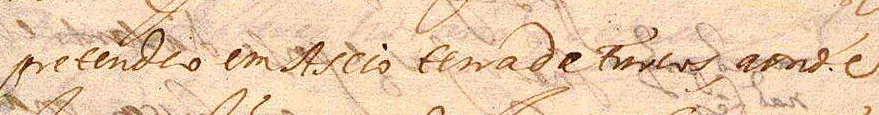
pretendeo em Ascio terra de Turcos, aonde
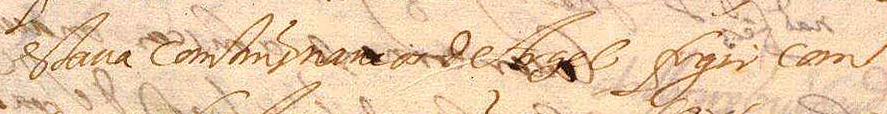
estaua com hūs nauios de Argel fugir com
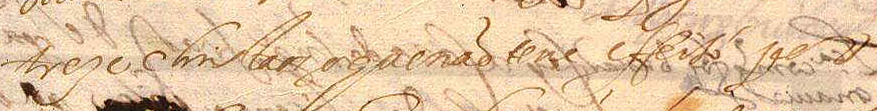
treze christaõs, o que naõ teue effeito por
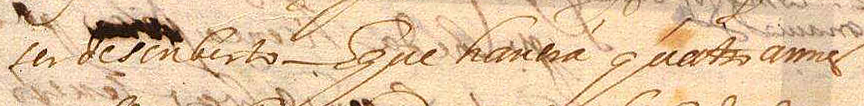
ser descuberto - E que hauerá quatro annos
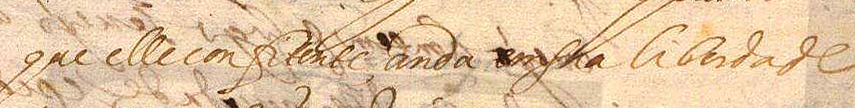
que elle confitente anda em sua liberdade
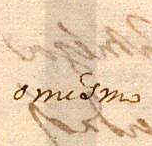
o mesmo
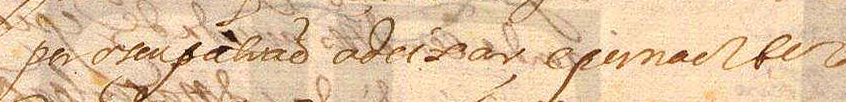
por o seu patraõ o deixar, e por naõ ter
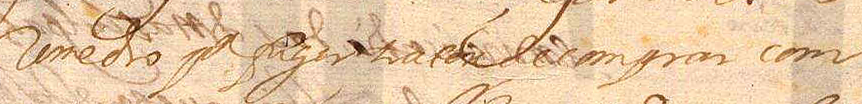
Remedio pa fugir tratou de comprar com
